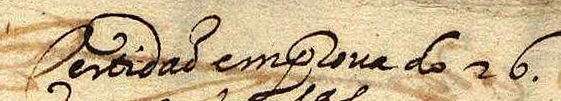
Certidaõ em proua do 26.
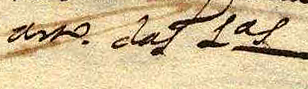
arto. das 1as
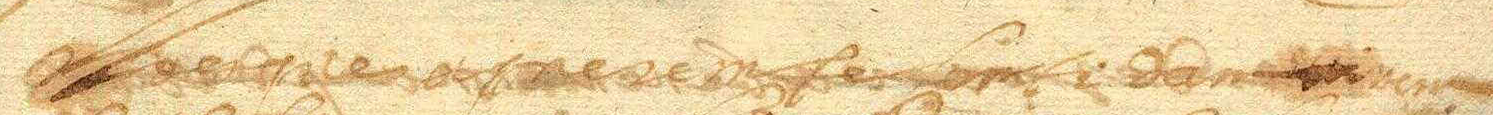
Aos que a prezemte Certidam uirem
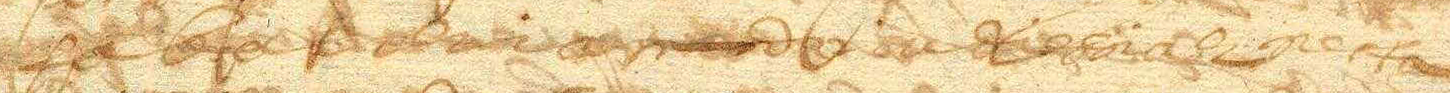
taballiam do iudissial nesta
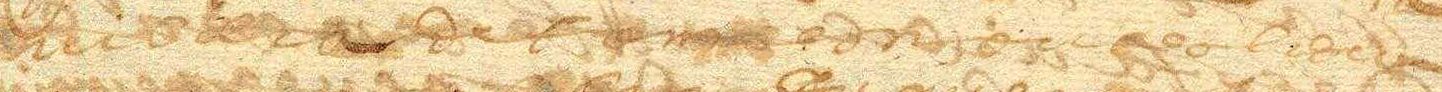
uilla de torres nouas E seu
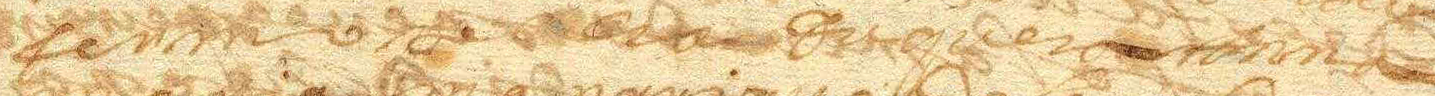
termo pella Duqueza Anna
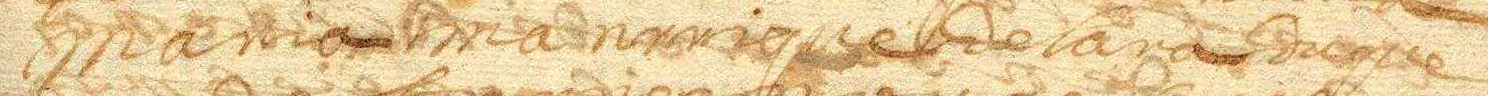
maria manrrique de lara duque
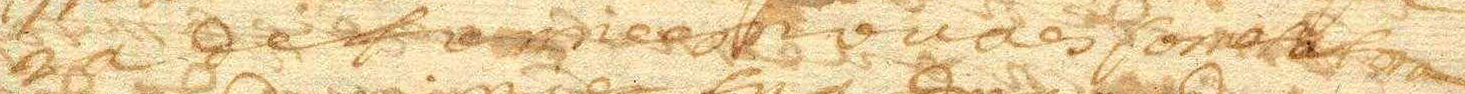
za de torres nouas Como tutora
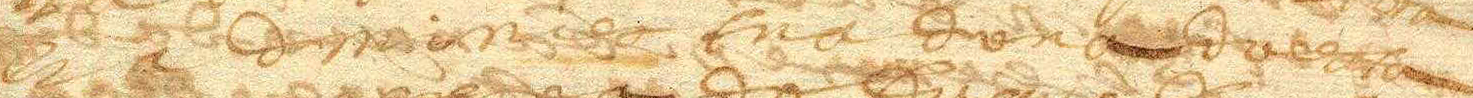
E administradora do esta
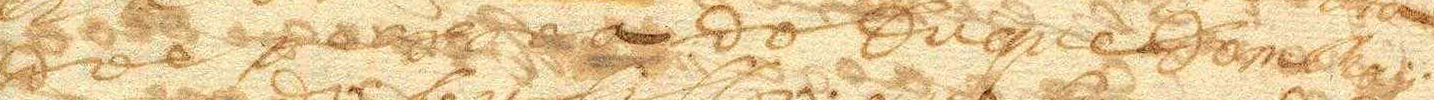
do e pessoa do Duque Dom Ray
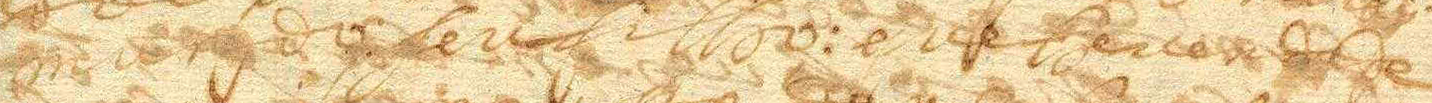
mundo seu filho: que he uerdade
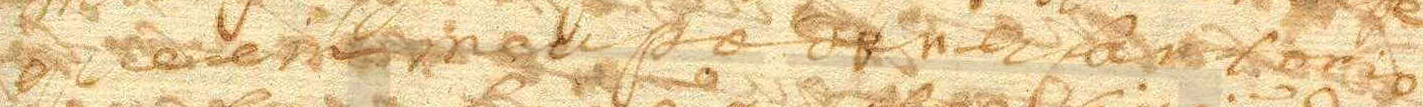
que em meu poder E Cartorio
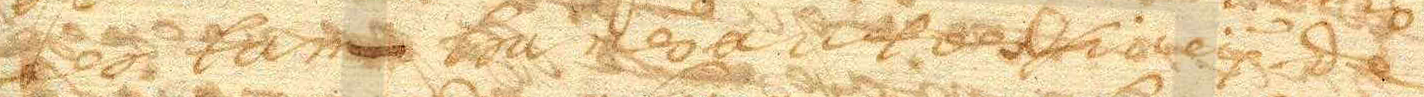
estam huns autos siueis de
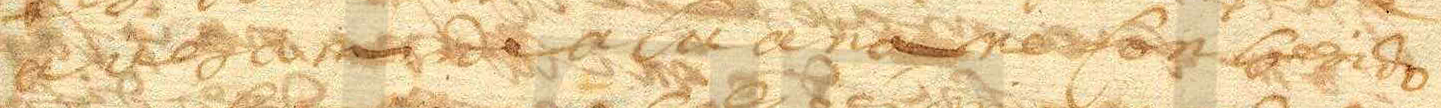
ausam de aluara reConhesido
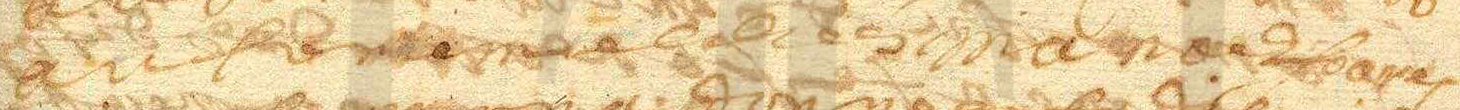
autor em elles manoel soares
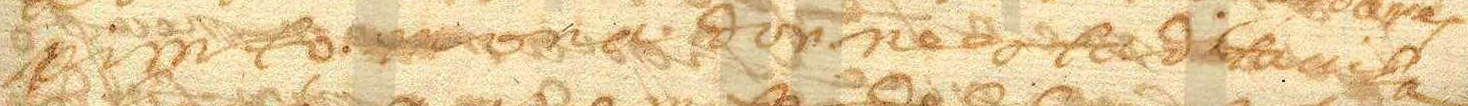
pimto. morador nesta dita uila
